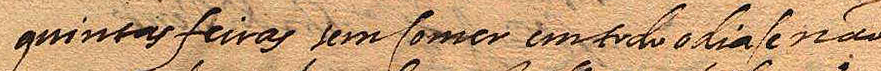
quintas feiras sem Comer em todo o dia senaõ
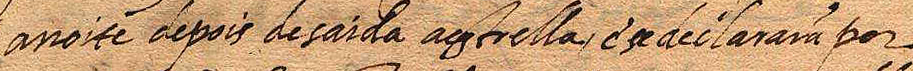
a noite depois de saida a estrella, e se declararā por
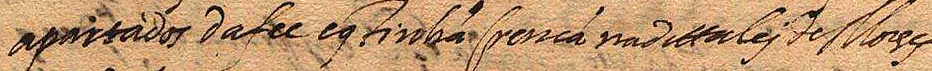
apartados da fee e q̄ tinhā Crença na ditta lej de Moises
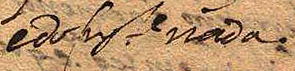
e do Custe nada.
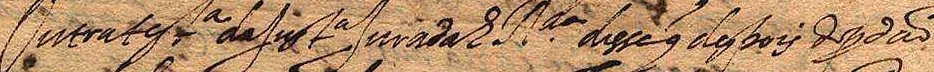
Outra testa da Justa Jurada e Rd.a disse q̄ despois do ꝑdaõ
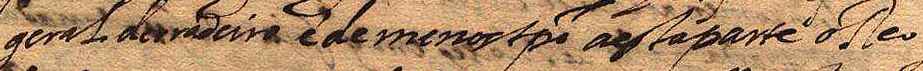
geral derradeiro e de menos tpō a esta parte o Reo
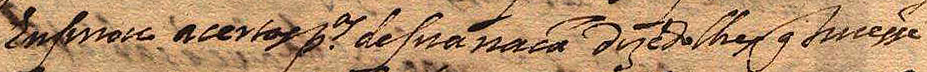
Ensinou a certas p.as de sua naçā dizēdolhes q̄ tiuessē
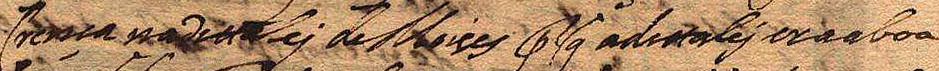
Crença na ditta lej de Moises p̄q̄ a ditta lej era a boa
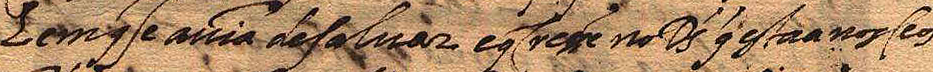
E em q̄ se auia de saluar e q̄ Cressē no Ds̄ q̄ estaa nos Ceos
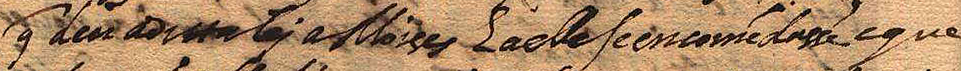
q̄ deu a ditta lej a Moises E a elle se encomēdassē e que
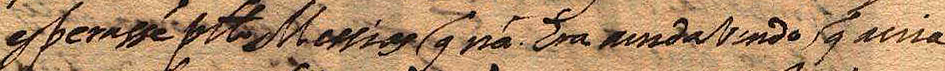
esperassē pll̄o Messias q̄ nā Era ainda vindo, q̄ auia
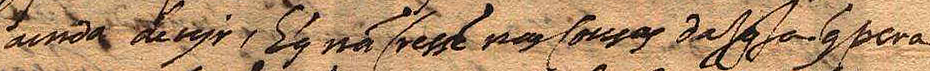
ainda de ujr, E q̄ nā Cressē nas Cousas da JḡJa q̄ pera
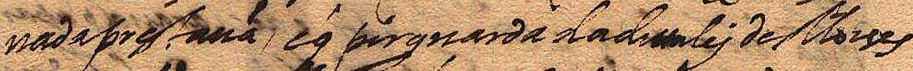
nada prestauā, e q̄ por guarda da ditta lej de Moises
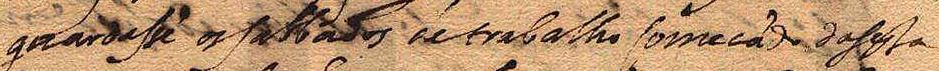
guardasse os sabbados de trabalho começādo da sesta
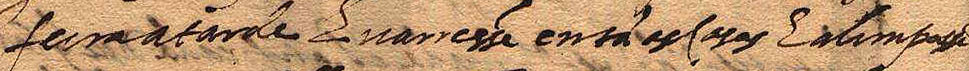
feira a tarde E uarressē entā as Casas E alimpassē
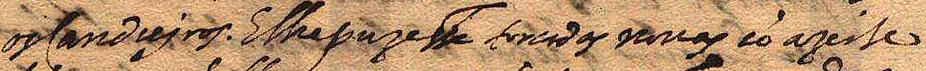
os Candiejros. E lhe puzessē torcidas nouas cō azeite
